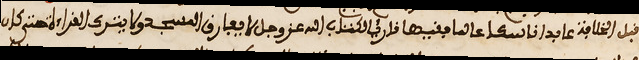قبل الخلافة عابدا ناسكا عالما فقيها قاريا لكتاب الله عز وجل لا يفارق المسجد ولايترك القراءة حتى كان
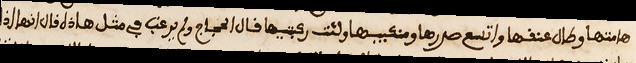هانتها وطال عنقها وا تسع صدرها ومنكبيها ولئت ركبتيها قال الحجاج ولم يرغب في مثل هاذه قال انها اذا
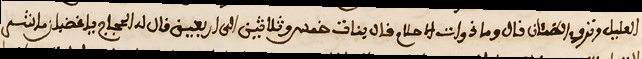العليل وتروى الظمئان قال ما ذوات الاحلام قال بنات خمس وثلاثين الى اربعين قال له الحجاج يا غضبان ما شر
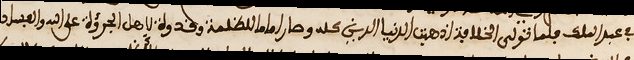في عبد الملك فلما تولى الخلافة اذهبت الدنيا الدين كله وصار اماما للظلمة وقدوة لاهل الجرؤة على الله والفساد
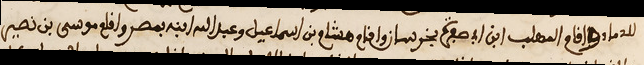للدماء واقام المهلب ابن ابى صفرة بخرسان واقام هشام بن اسماعيل وعبد الله ابنه بمصر واقلع موسى بن نصير
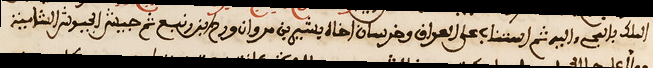الملك بالمجىء اليه ثم استناب على العراق وخرسان اخاه بشير بن مروان ورح بن رنبع ثم جيش الجيوش الشامية
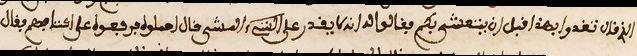الذي قال تغدوا بهذا قبل ان يتعشى بكم فقاوا له انه لا يقدر على الشىء قال احملوه فرفعوه على اكتافهم فقال
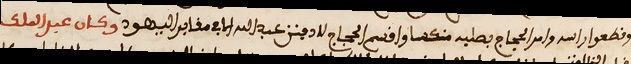وقطعوا راسه وامر الحجاج بصلبه منكسا واقسم الحجاج لادفنن عبد الله الا في مقابر اليهود وكان عبد الملك
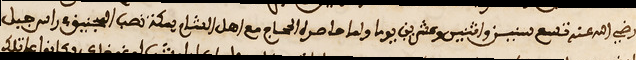رضي الله عنه تسع سنين واثنين وعشرين بن يوما ولما حاصره الحجاج مع اهل الشام بمكة نصب المنجنين في راس جبل
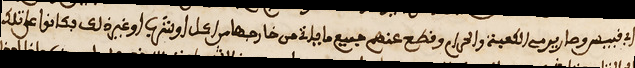ابى قيس وصار يرمى الكعبة والحرام وقطع عنهم جميع ما ياتى من خارجها من اكل او شرب او غير ذلك فكاموا على تلك
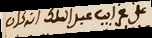على مغريب عبد الملك انه كان
